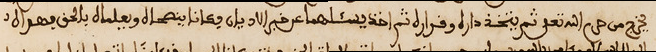يخرج من حرم الله تعلى ثم يتخذ داره وقراره ثم اخذ يسئلهما عن خبر الاديان فكانا ينصحاه ويعلماه بالحق فهداه
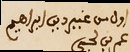اول من غير دين ابراهيم
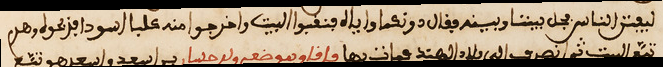ليفتن الناس فحل بيننا وبينه فقال دونكما واياه فنقبوا البيت واخرجوا منه كلبا اسودا فذبحوه وهدم
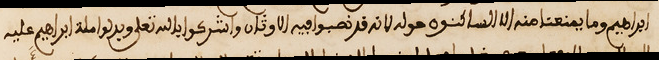ابراهيم وما يمنعنا منه الا الساكنون حوله لانه قد نصبوا فيه الاوثان واشركوا بالله تعلى وبدلوا ملة ابراهيم عليه
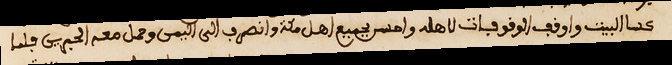كسا البيت واوقف الوقوفات لاهله واحسن بجميع اهل مكة وانصرف الى اليمن وحمل معه الحبرين فلما
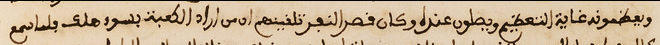يعظمونه غاية التعظيم ويصلون عنده وكان قصر النفر تلقينهم ان من اراد الكعبة بسوء هلك فلما سمع
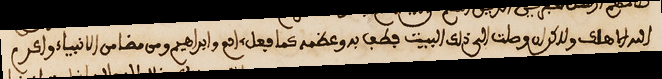الله الا هلك ولاكن ان وصلت الى ذلك البيت فطف به وعظمه كما فعل ءادم وابراهيم ومن مضا من الانبياء واكرم
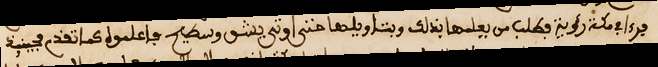فرءا في مكة رؤية فطلب من يعلمها بدلك وبتاويلها حتى اوتى يشق وسطيح فاعلموه كما تقدم فحينئذ
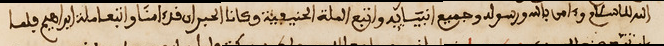الله للاسلام وءامن بالله ورسوله وجميع انبيايه واتبع الملة الحنيفية وكانا الحبران قد ءامنا واتبعا ملة ابراهيم فلما
